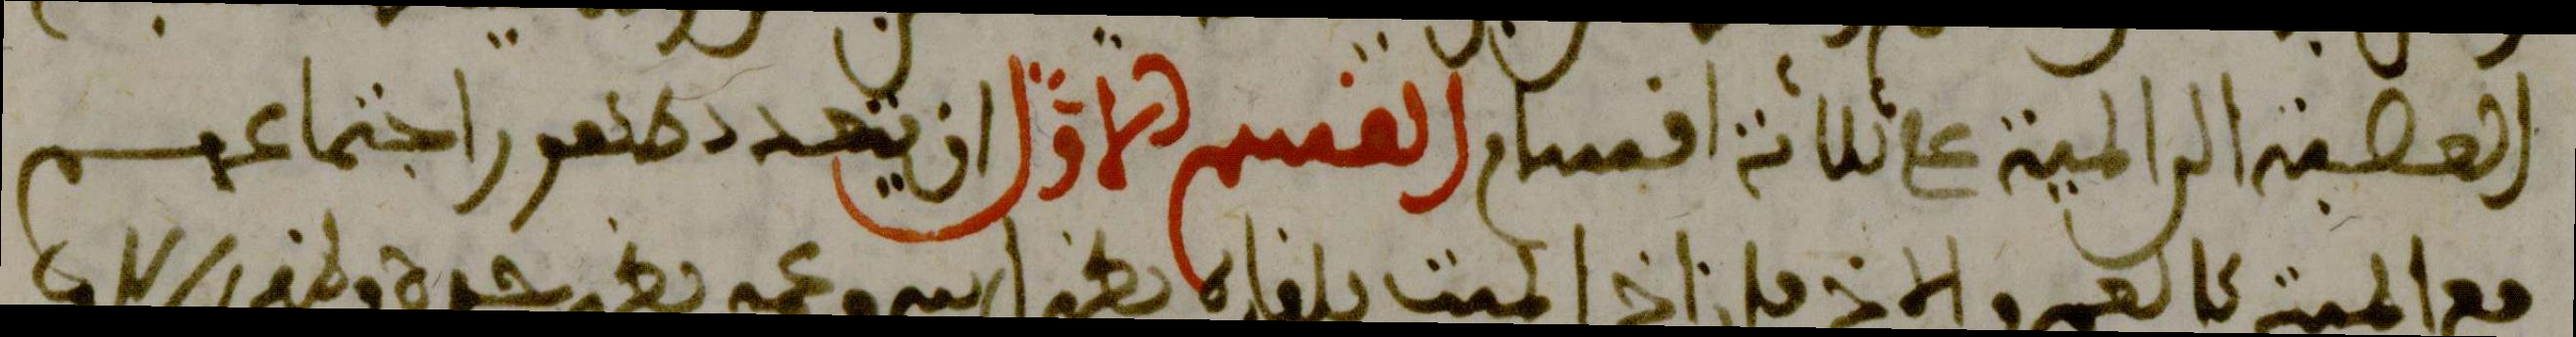العصبة الى المية على ثلاثة اقسام القسم الاوّل ان يتعدد طهور اجتماعهم
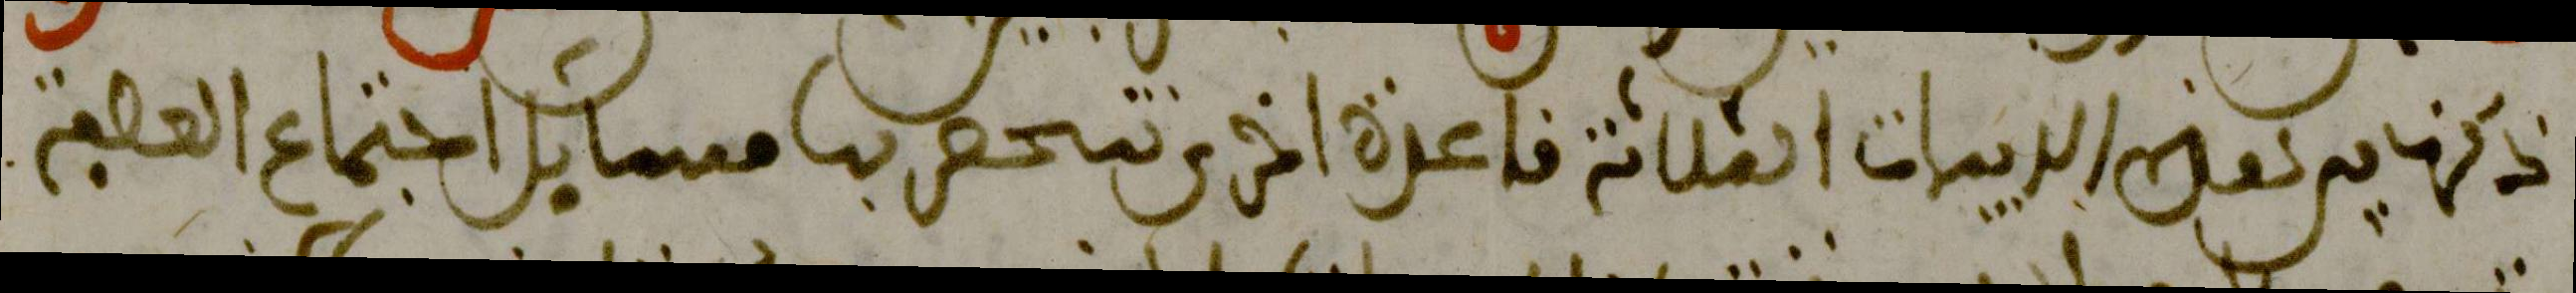ذكرن في هذه الابيات الثلاثة قاعدة اخرى تنحصر بها مسائل اجتماع العصبة
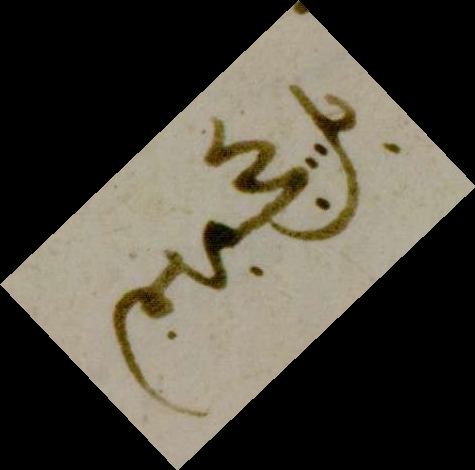بل يحجبهم
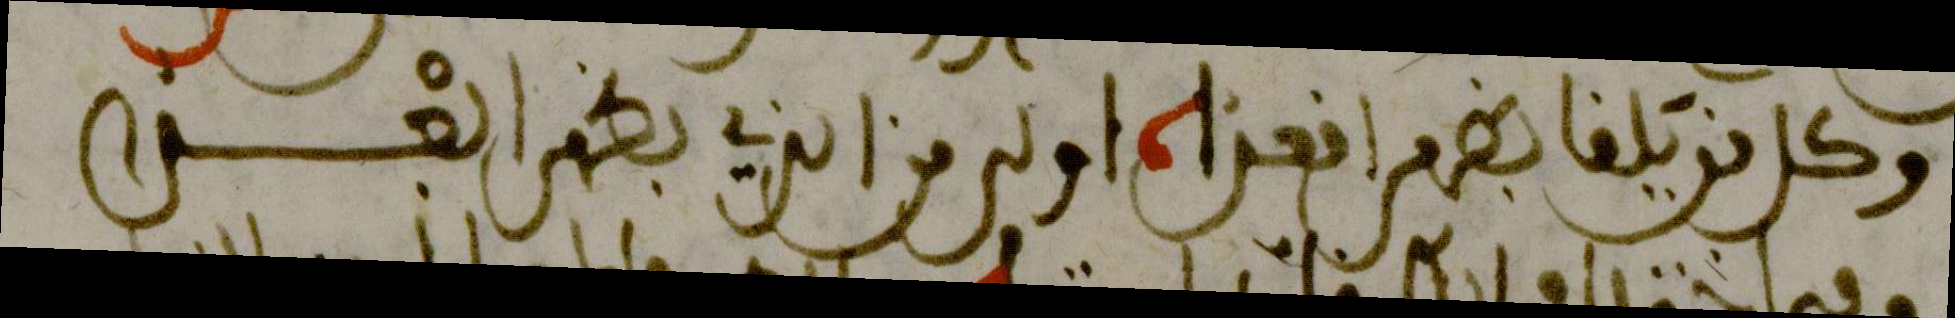وكل من يَلقا بظهر اقعدا اولى من الذي بظهر ابْعدا
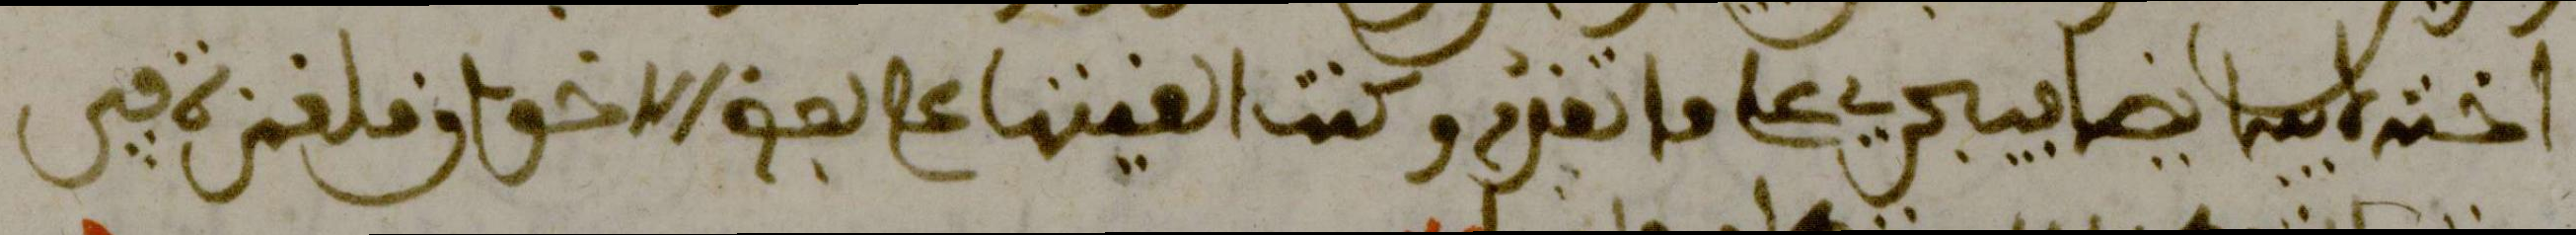اخته لابيه ايضا فيجري على ما تقدم وكنت القيتها على بعض الاخوان ملغزة في
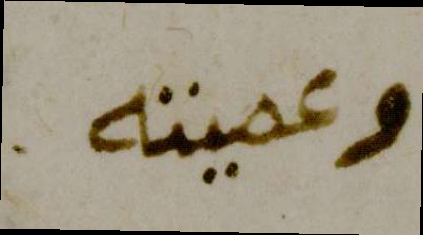وعميته
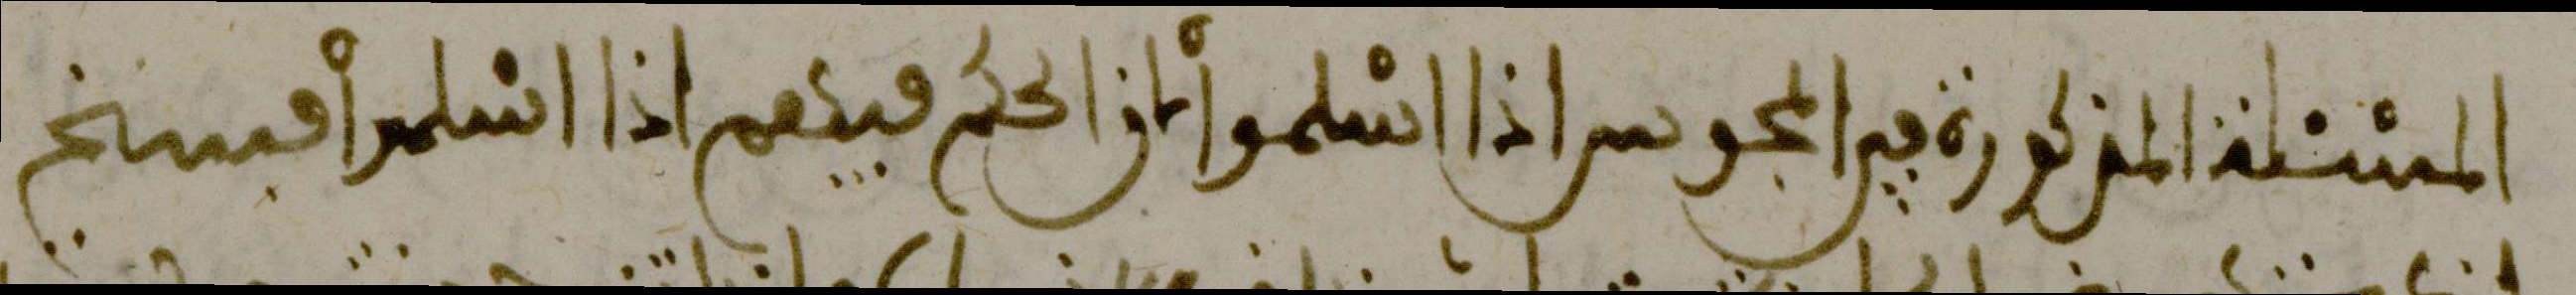المسْئلة المذكرة في المجوس اذا اسْلموا لان الحكم فيهم اذا اسْلم افسخ
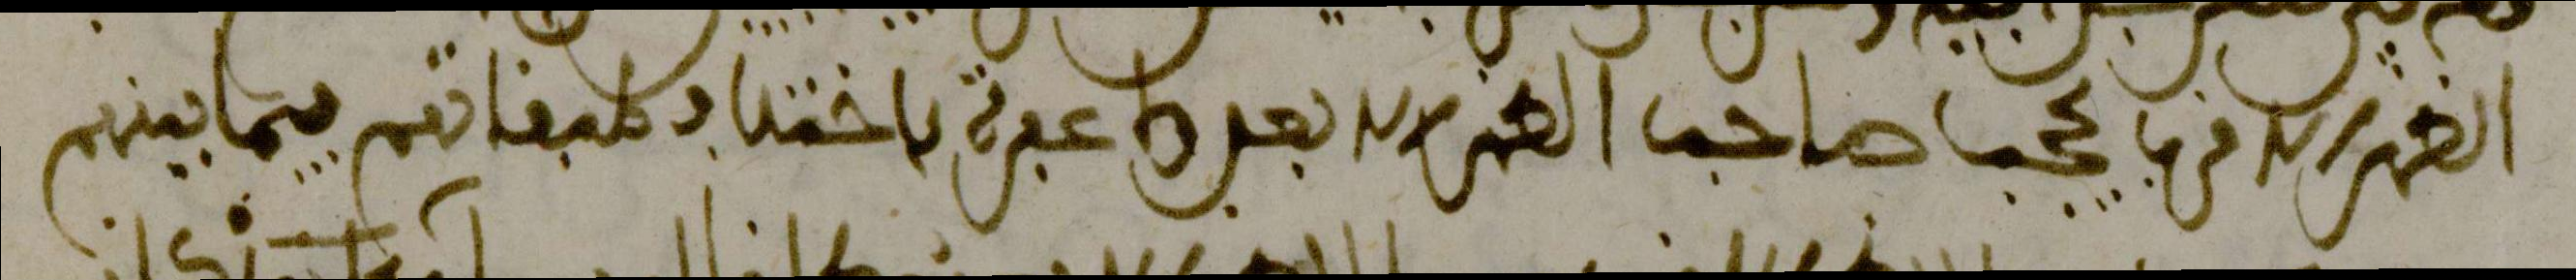الظهر الاقرب يحجب صاحب الظهر الابعد ولا عبرة باختلاف طبقاتهم فيما بينهم
